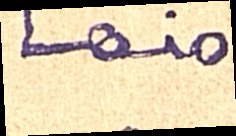منها
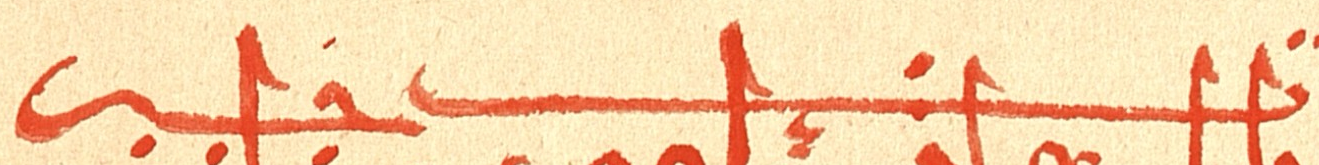ت جى
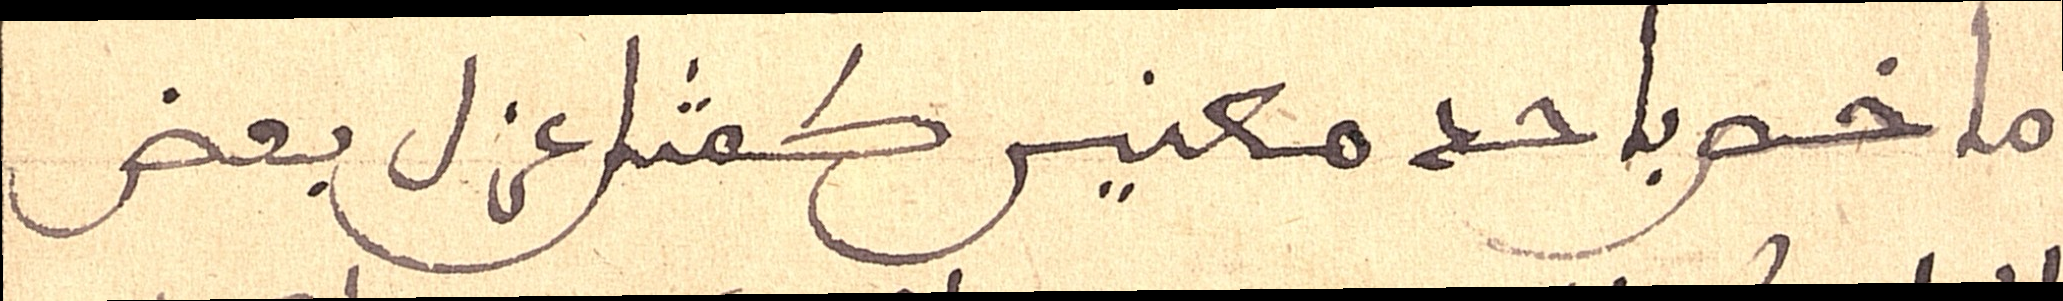ماخص باحد معنين كمثل عزل بعض
